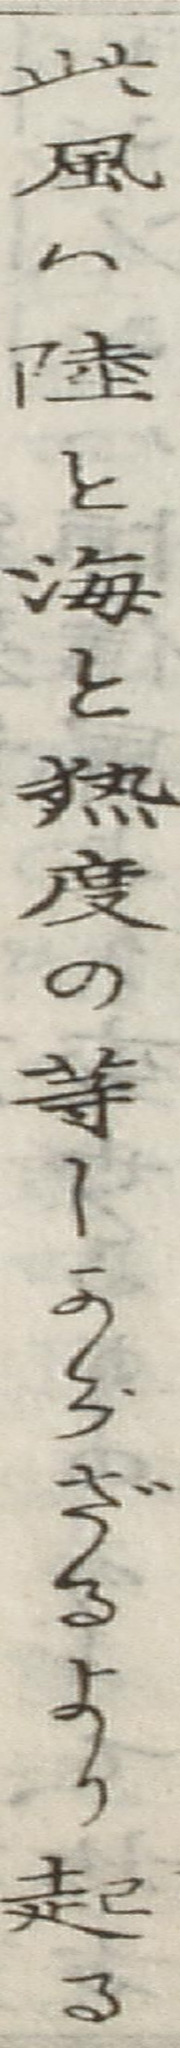此風は陸と海と熱度の等しからざるより起る
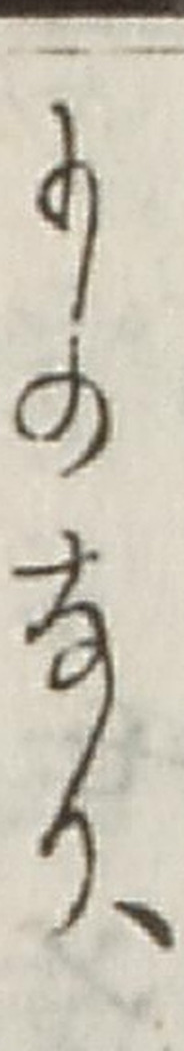ものなり、
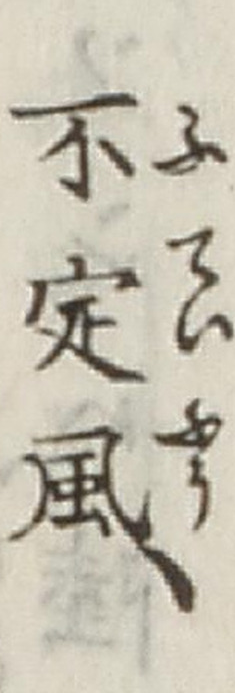不定風、
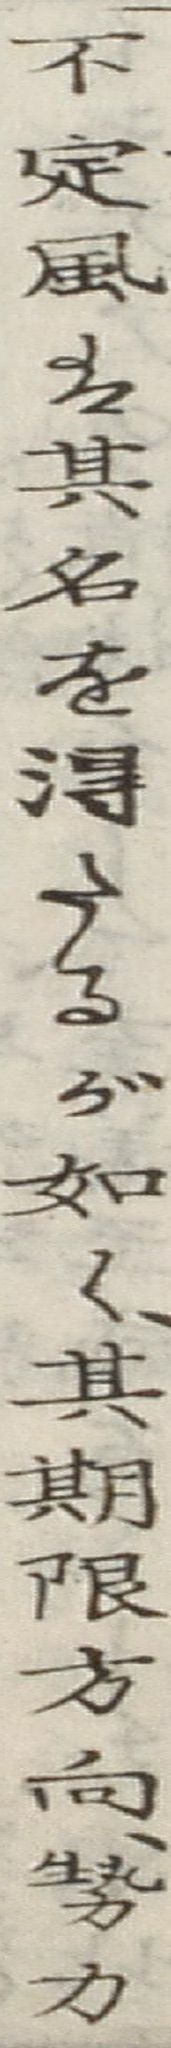不定風は其名を得たるが如く、其期限、方向、勢力
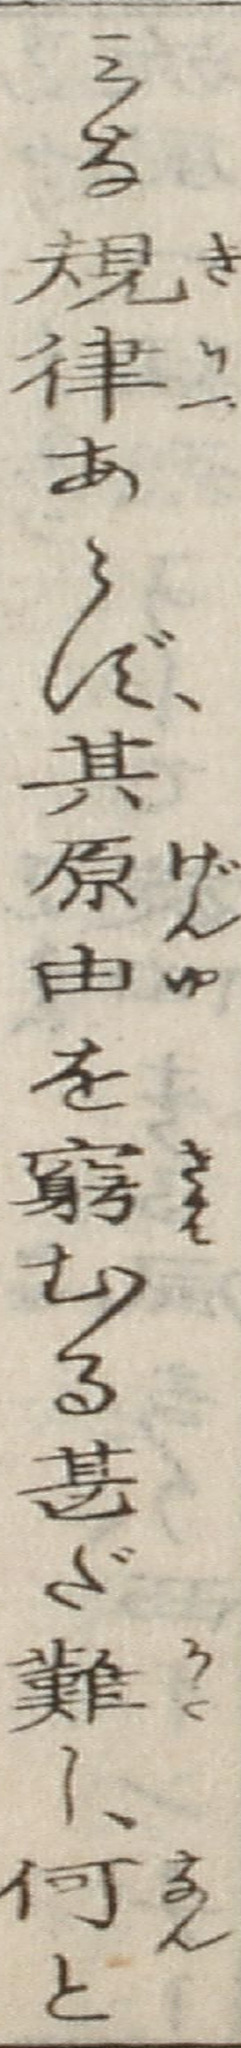みな規律あらず、其原由を窮むる甚だ難し、何と
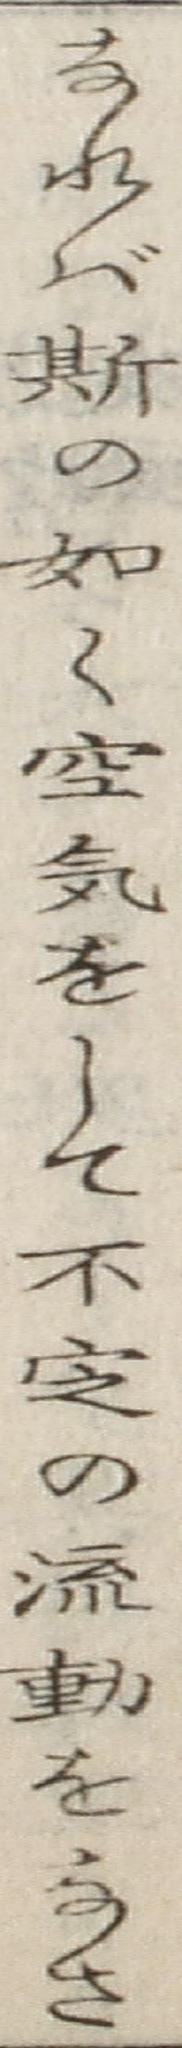なれば斯の如く空気をして不定の流動をなさ
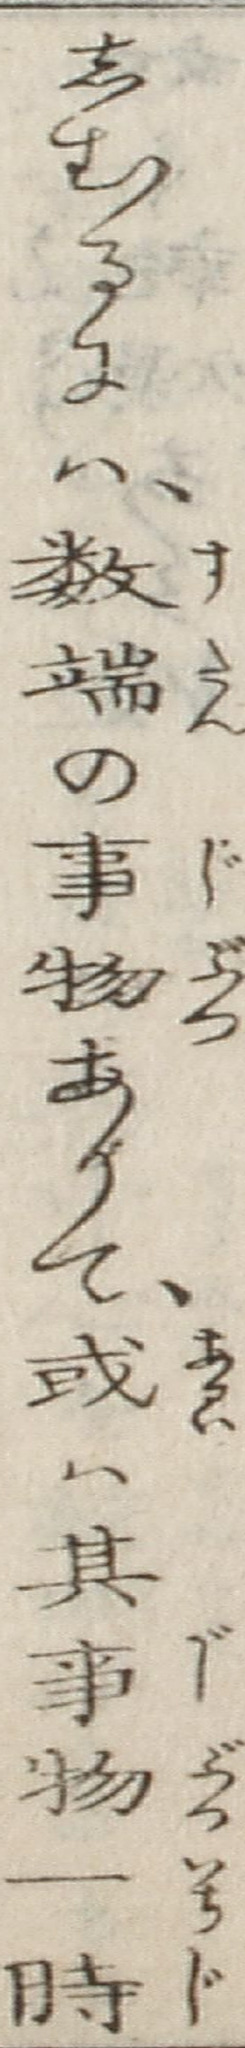しむるには、数端の事物ありて、或は其事物一時
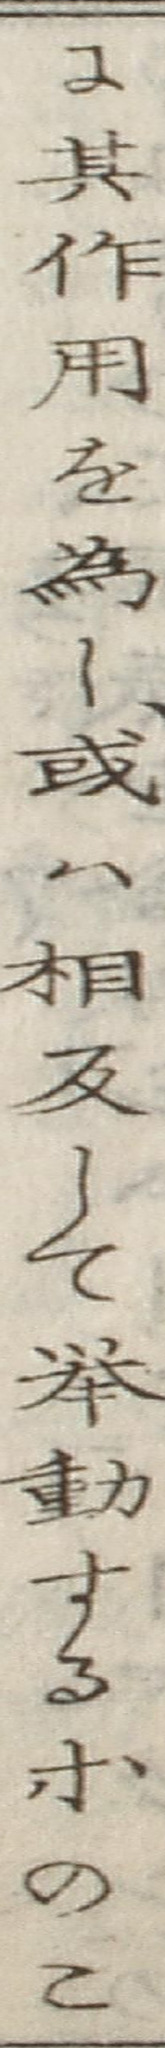に其作用を為し、或は相反して挙動する等のこ
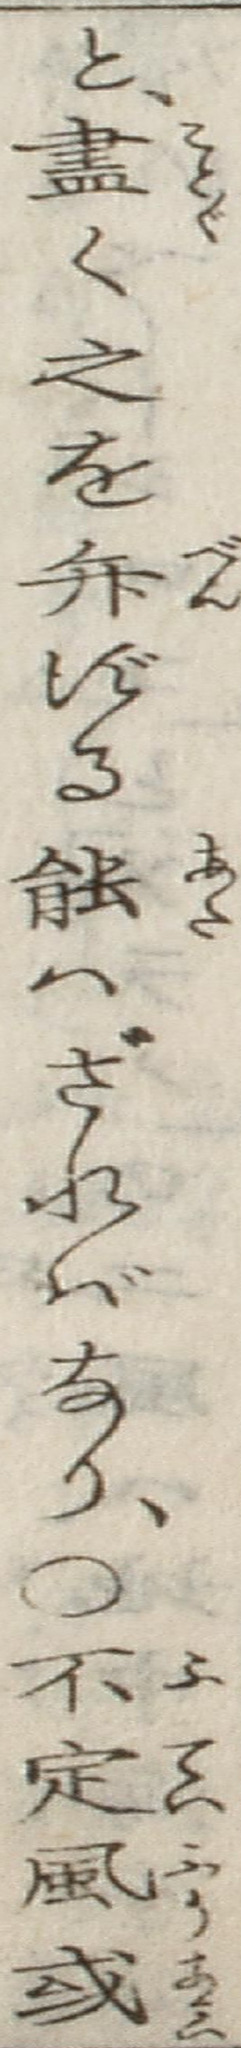と、尽く之を弁ずる能はざればなり、○不定風或
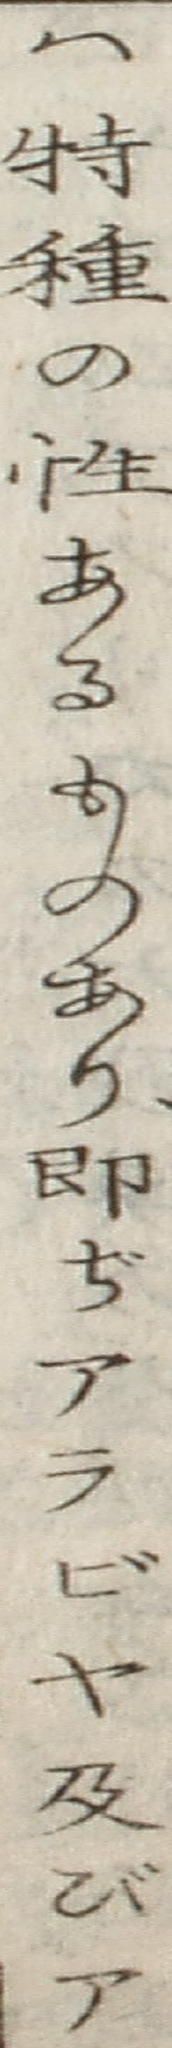は特種の性あるものあり、即ちアラビヤ及びア
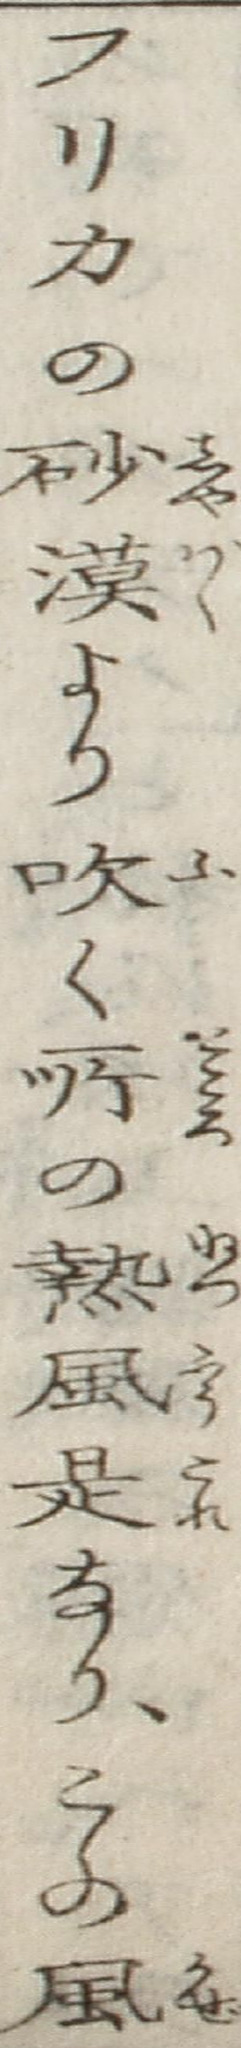フリカの砂漠より吹く所の熱風是なり、その風
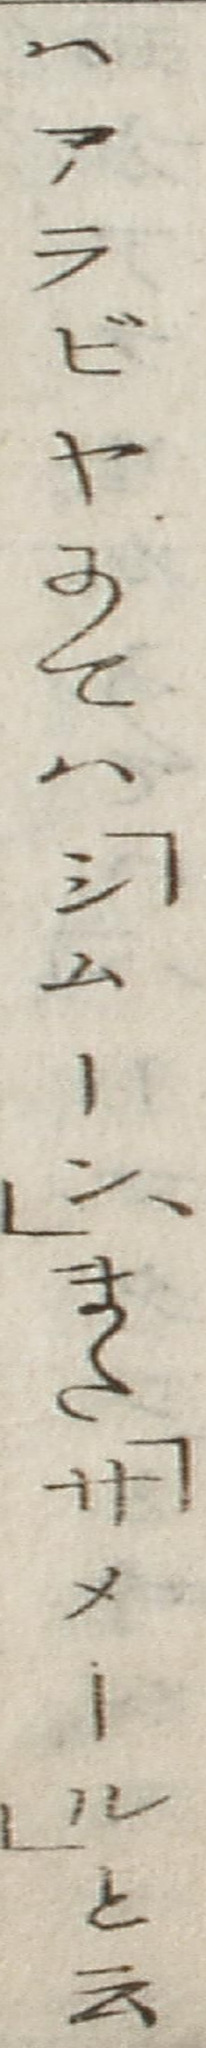はアラビヤにては「シムーン、」また「サメール」と云
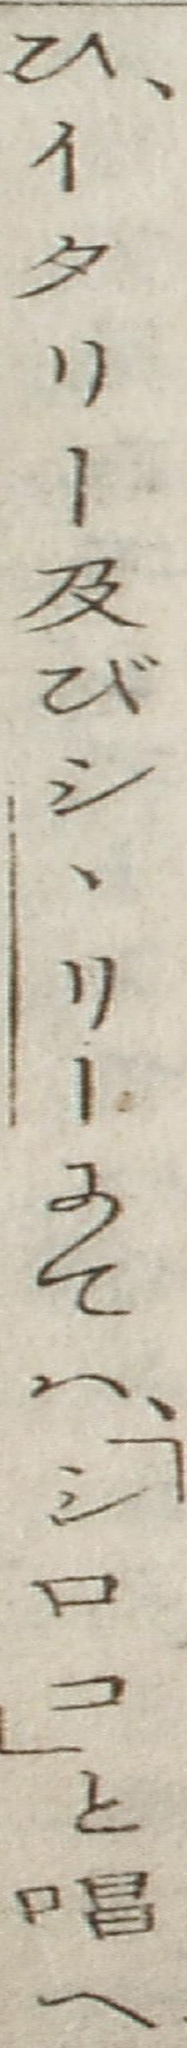ひ、イタリー及びシヽリーにては、「シロコ」と唱へ、

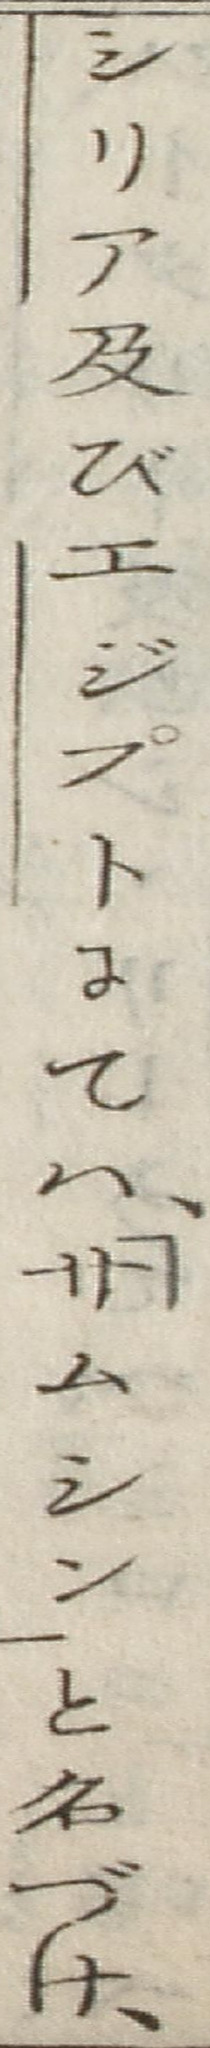シリア及びエジプトにては、「サムシン」と名づけ、
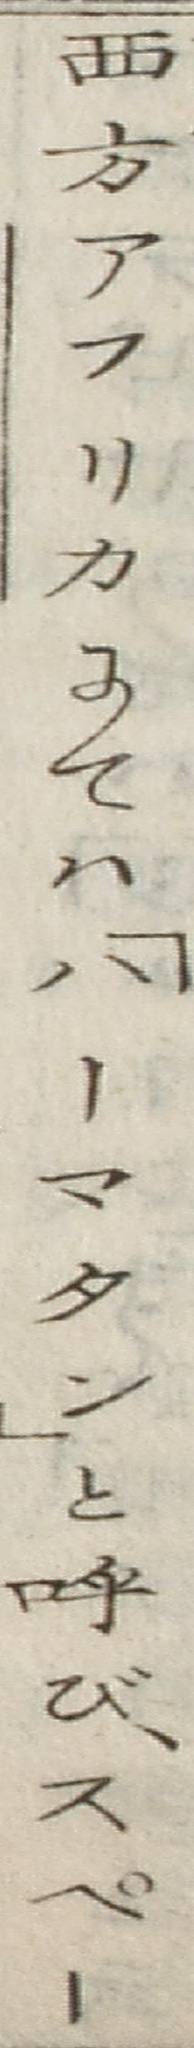西方アフリカにては「ハーマタン」と呼び、スペー
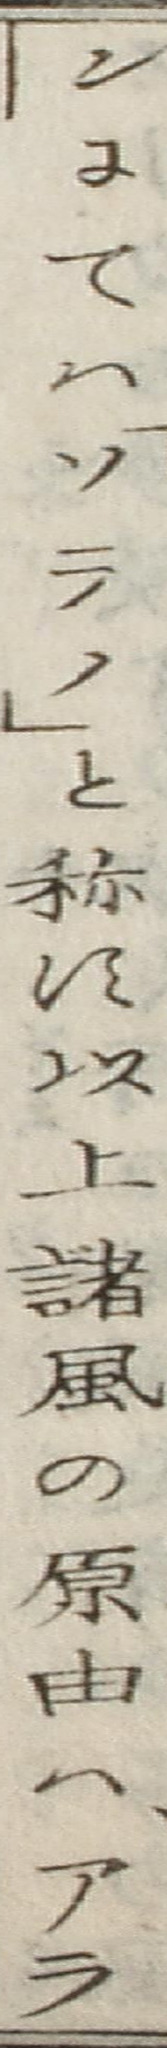ンにては「ソラノ」と称す、以上諸風の原由は、アラ
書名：訓蒙　天然地理學　中
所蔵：東京大学地震研究所図書室 Earthquake Research Institute Library, The University of Tokyo, JAPAN
